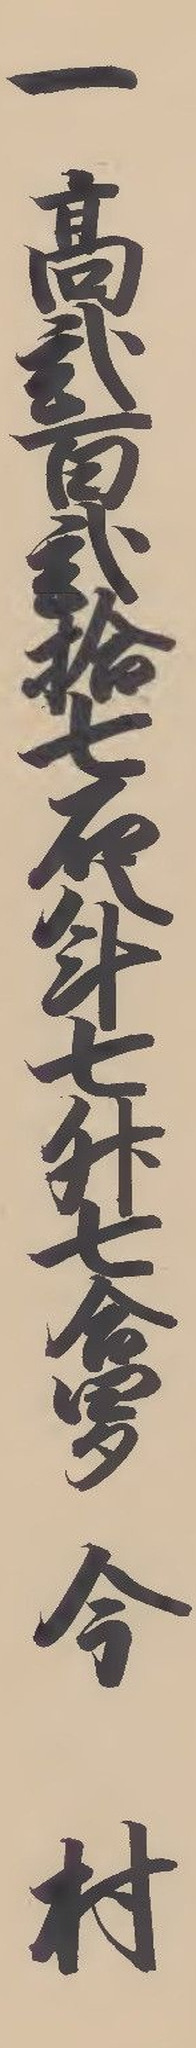一高弐百弐拾七石八斗七升七合四勺今村

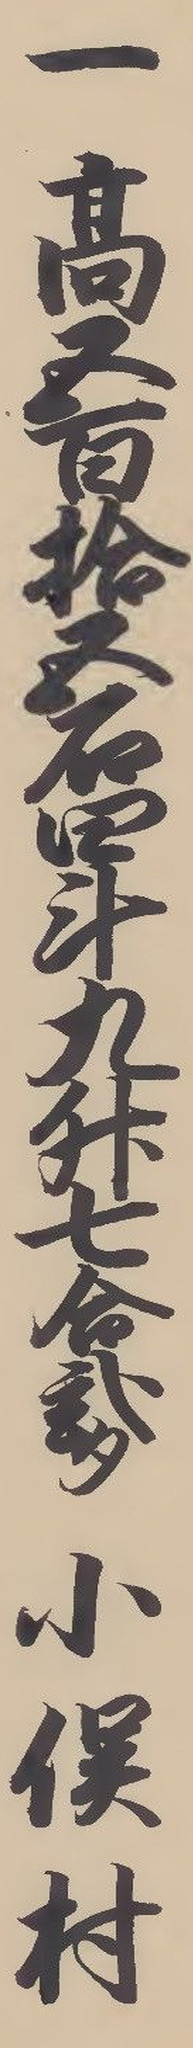一高五百拾五石四斗九升七合弐勺小俣村
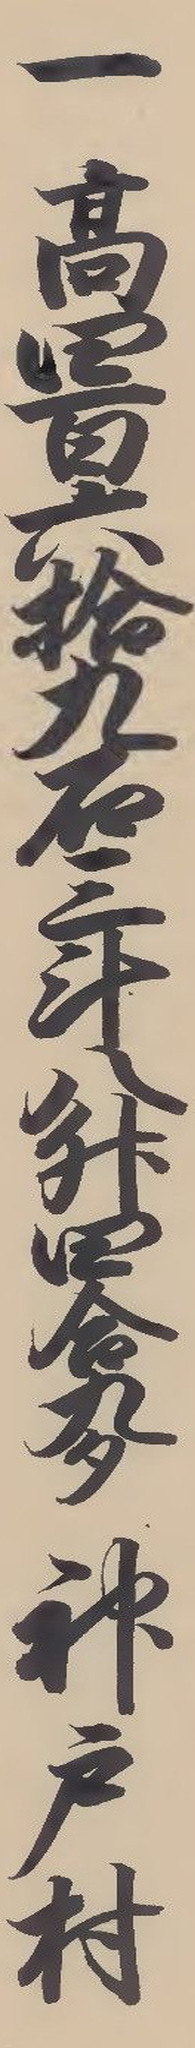一高四百六拾九石三斗八升四合九勺神戸村
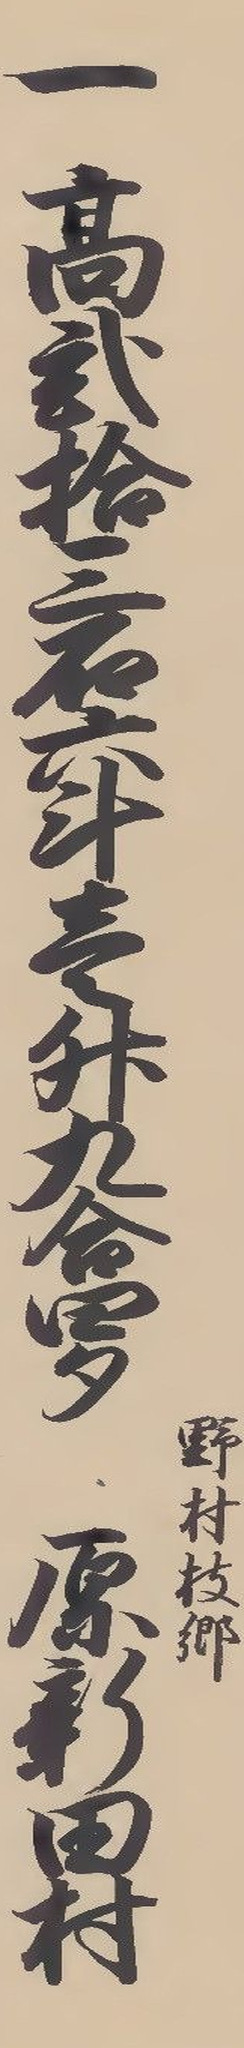一高弐拾三石六斗壱升九合四勺原新田村
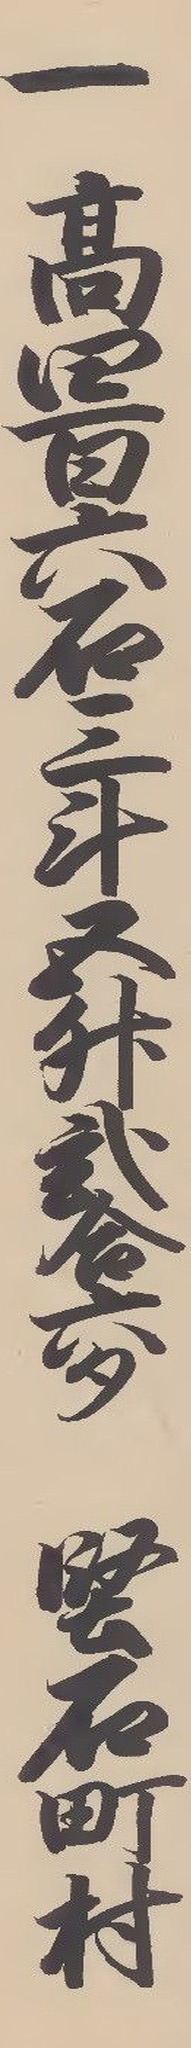一高四百六石三斗五升弐合六勺堅石町村
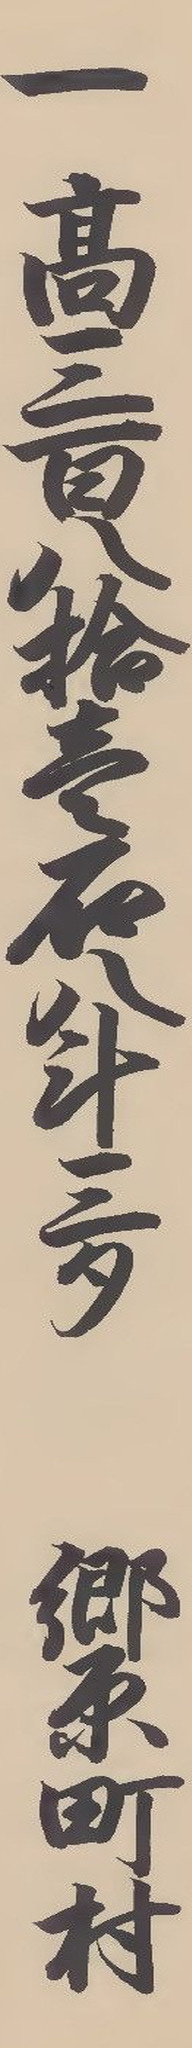一高三百八拾壱石八斗三勺郷原町村
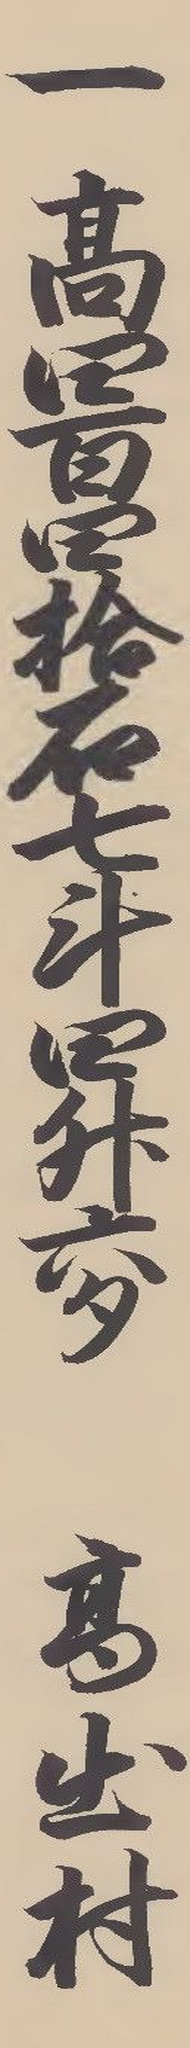一高四百四拾石七斗四升六勺高出村
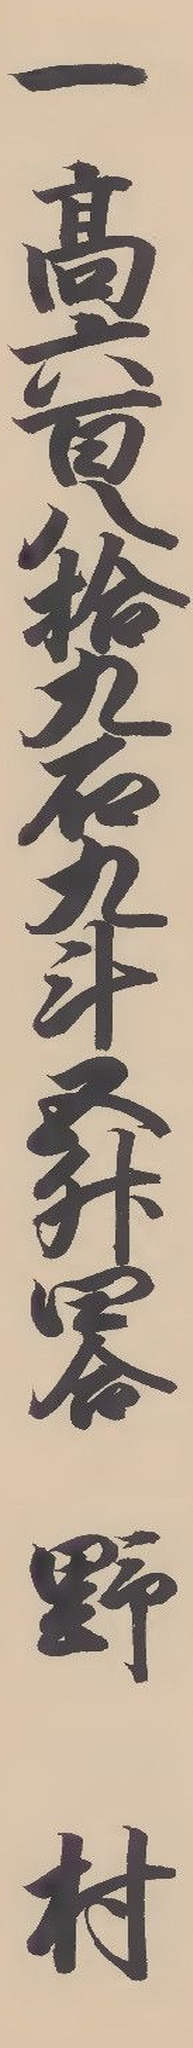一高六百八拾九石九斗五升四合野村

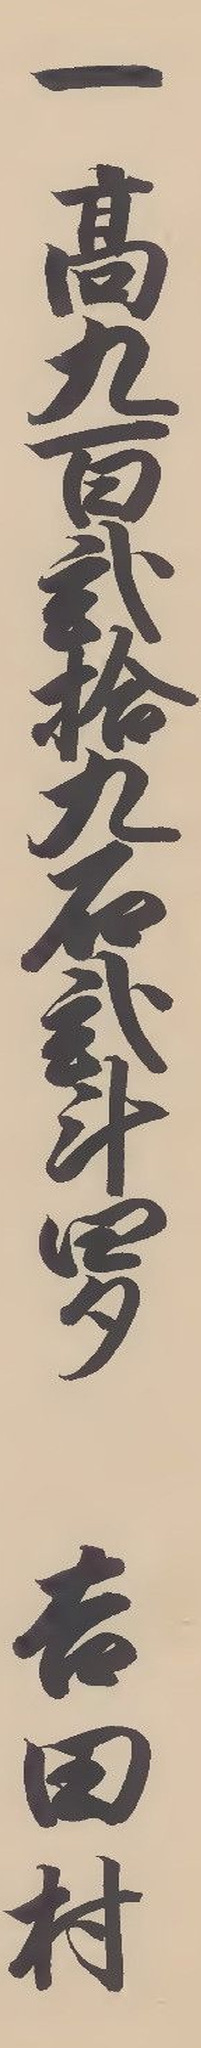一高九百弐拾九石弐斗四勺吉田村
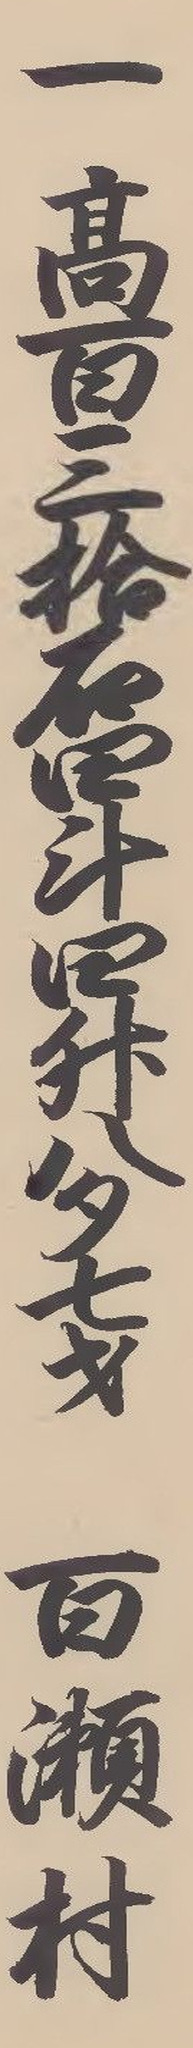一高百三拾石四斗四升八勺七才百瀬村
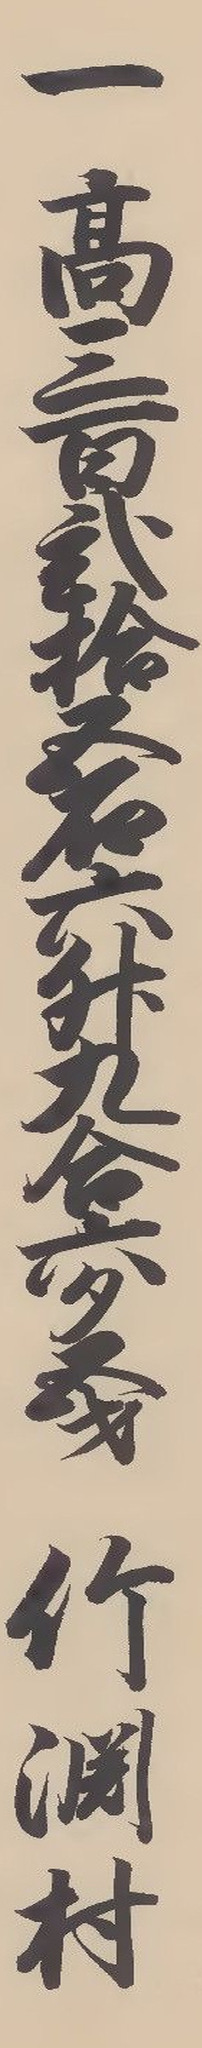一高三百弐拾五石六升九合六勺五才竹淵村
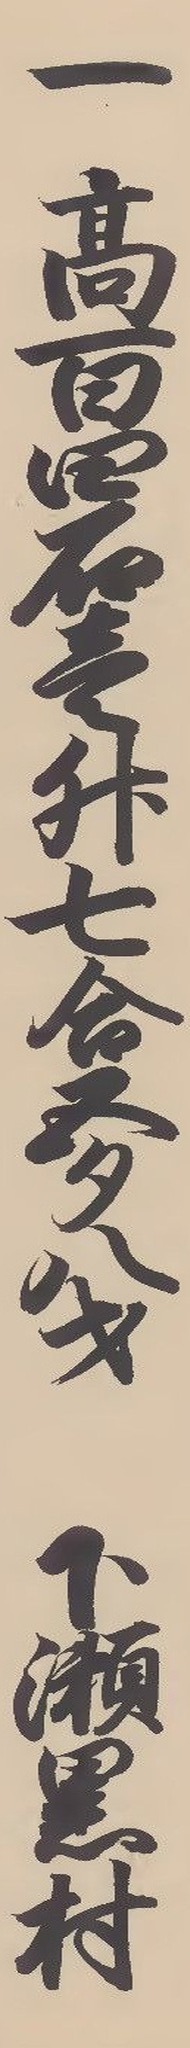一高百四石壱升七合五勺八才下瀬黒村
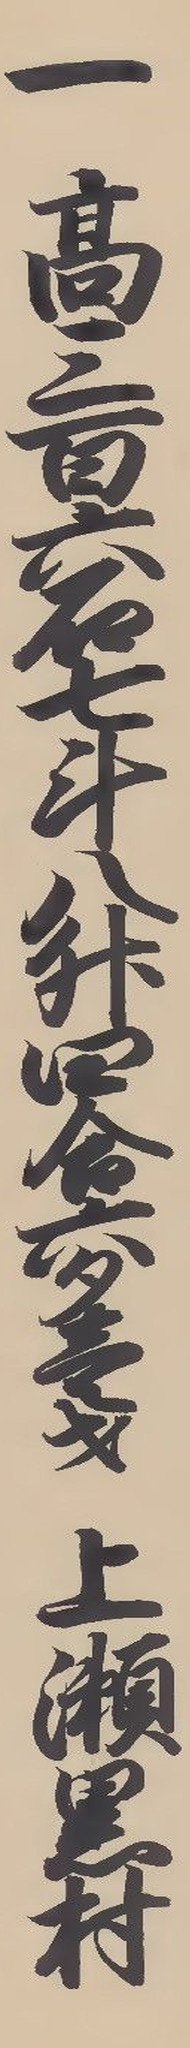一高三百六石七斗八升四合六勺壱才上瀬黒村
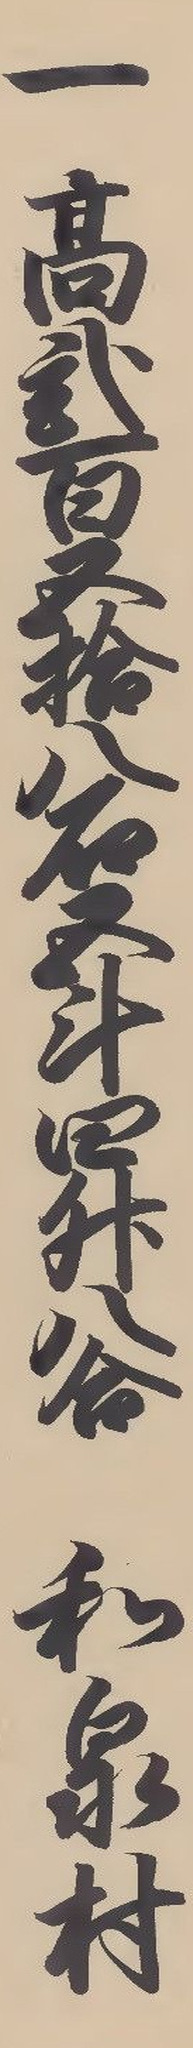一高弐百五拾八石五斗四升八合和泉村
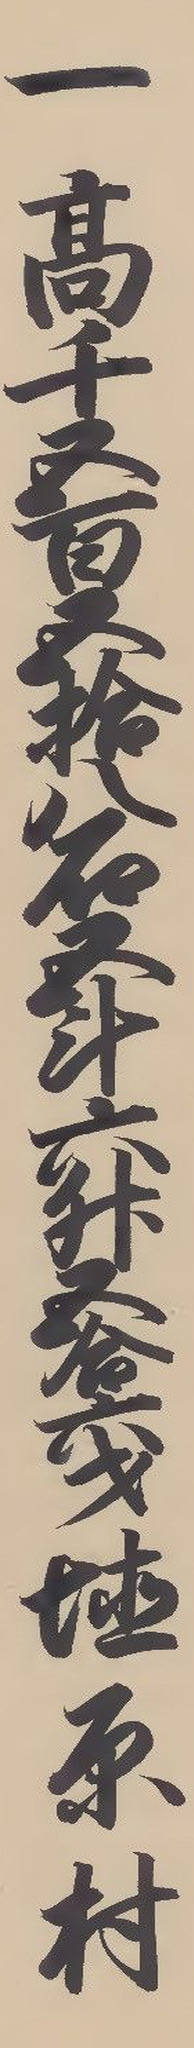一高千五百五拾八石五斗六升五合六才埴原村
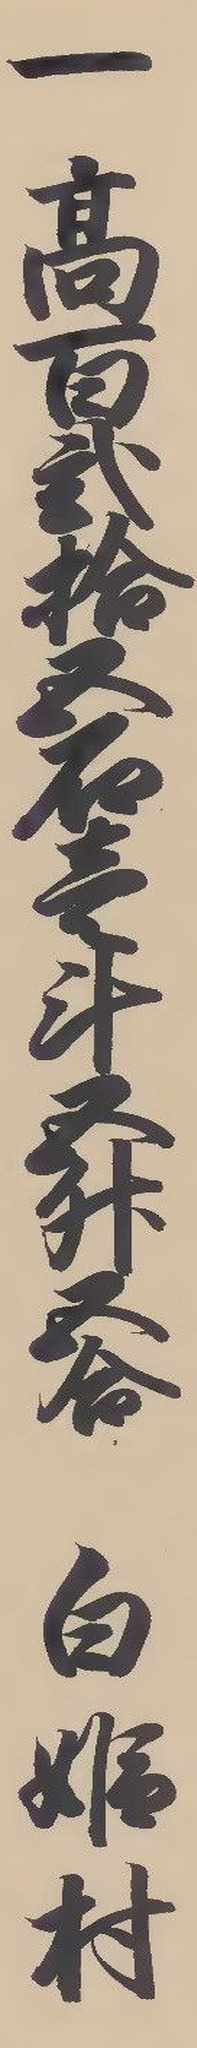一高百弐拾五石壱斗五升五合白姫村
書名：信濃国郷帳
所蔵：国立公文書館 National Archives of Japan
